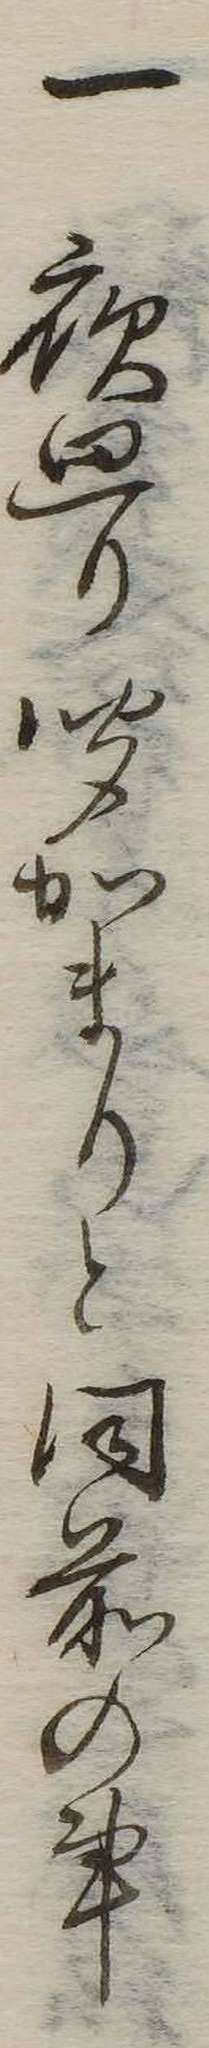一夜廻り聞かまりと同前の事
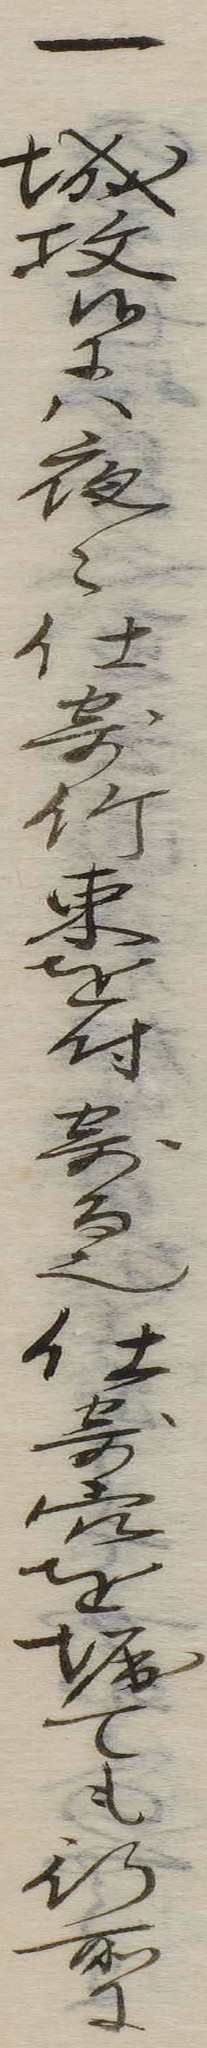一城攻候には夜々仕寄竹束を付寄る也仕寄穴を堀ても行所に
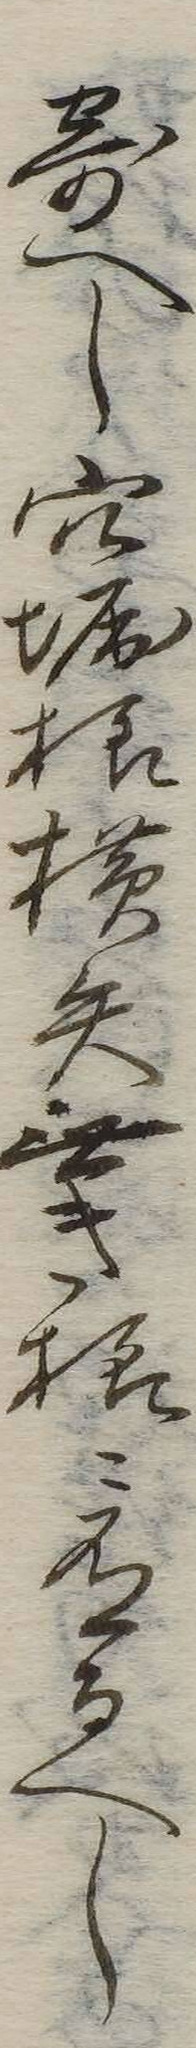寄へし穴堀様横矢無き様ニ有るへし
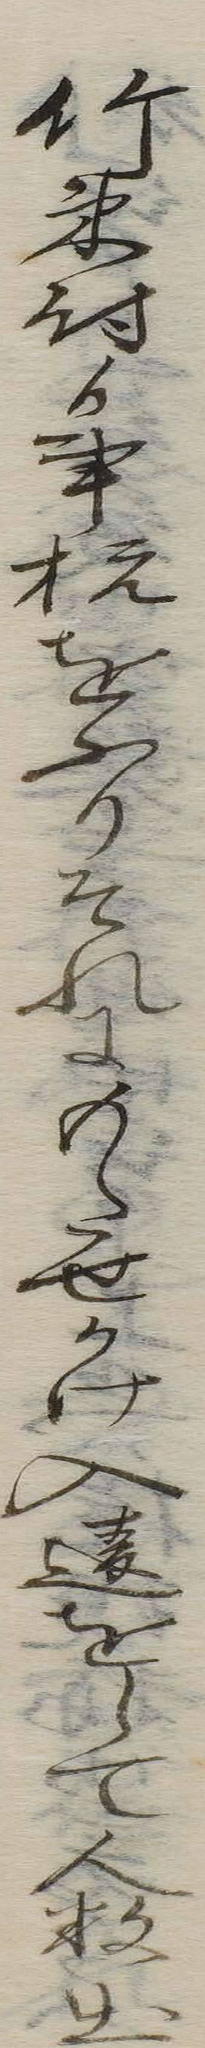一竹束付候事杭をふりそれにもたせかけ入違をして人数出
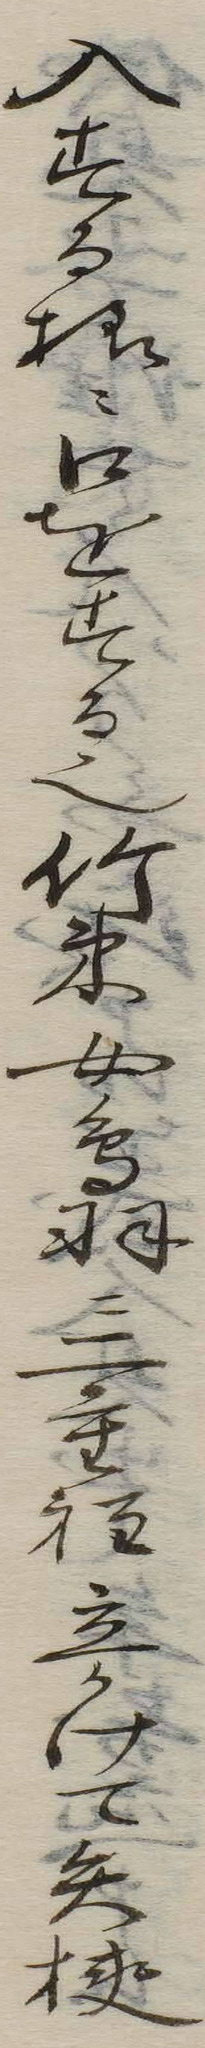入する様ニ口をする也竹束如鳥羽ニ二重程立かけて矢挟
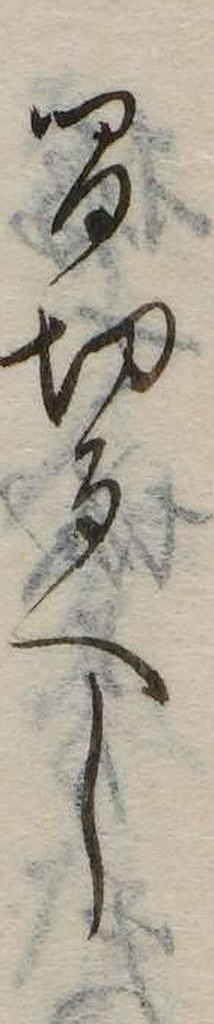間切るへし
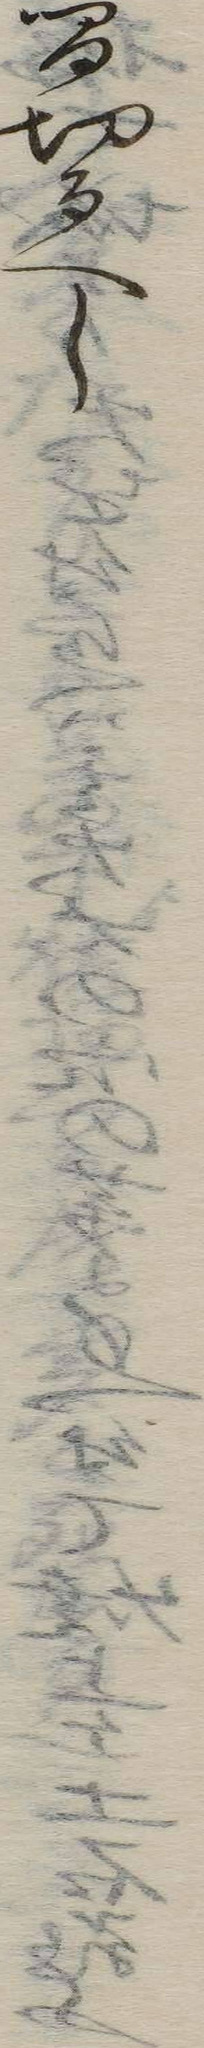間切るへし
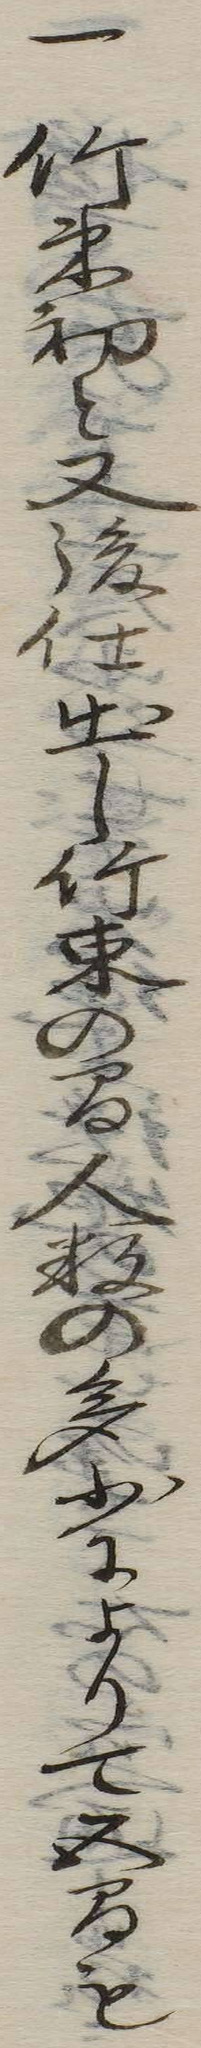一竹束初と又後仕出し竹束の間人数の多少によりて五間も
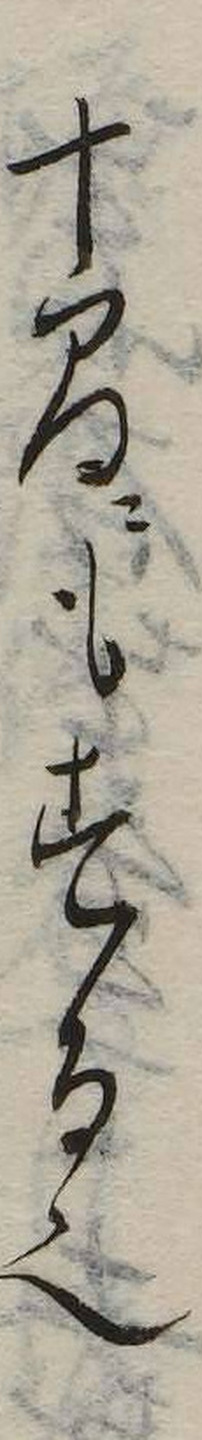十間ニもする也
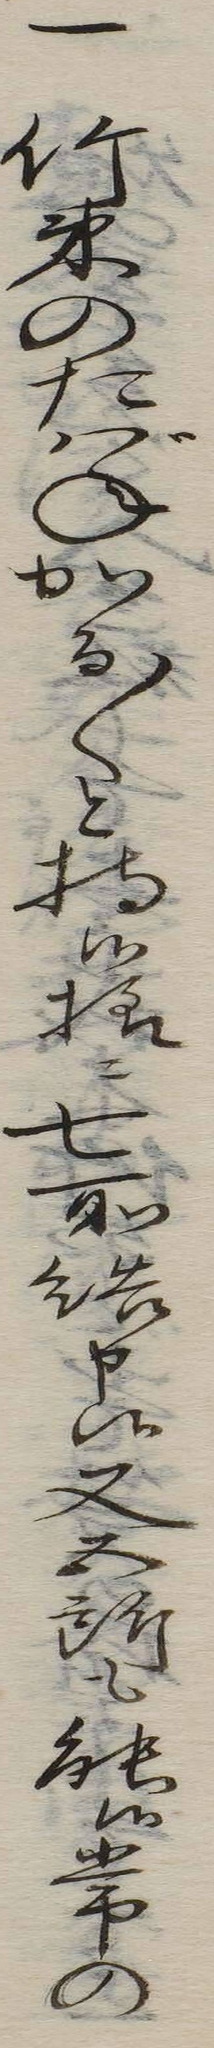一竹束のたばねかる〳〵と持候様ニ七所結申候又五所能候常の
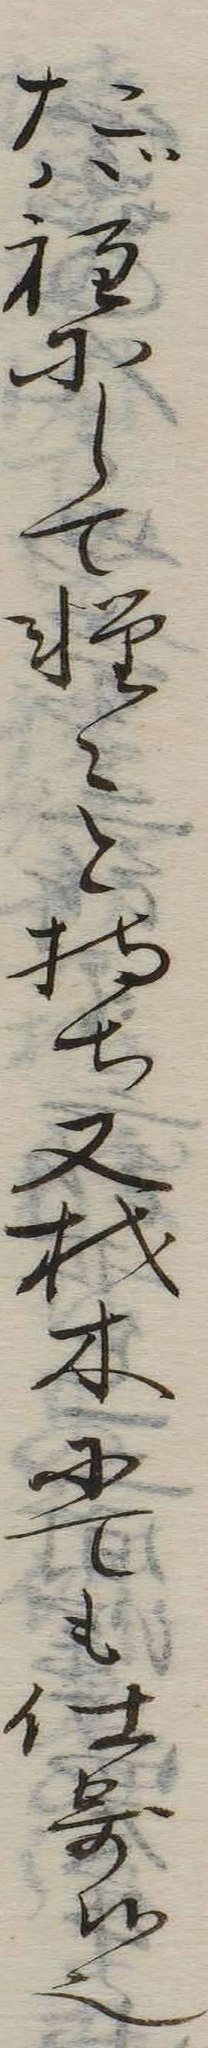たば程にして軽々と持ち又伐木にても仕寄候也
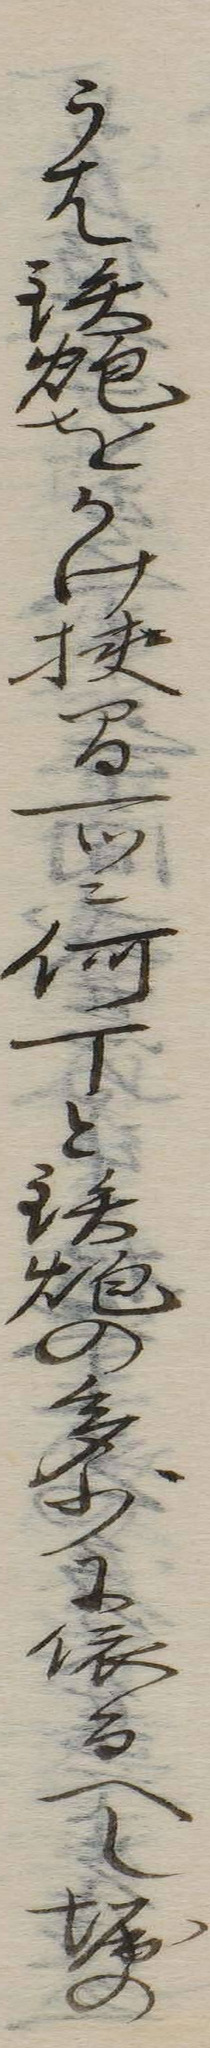一うは鉄炮をかけ挟間一ツニ何丁と鉄炮の多少に依るへし堀の
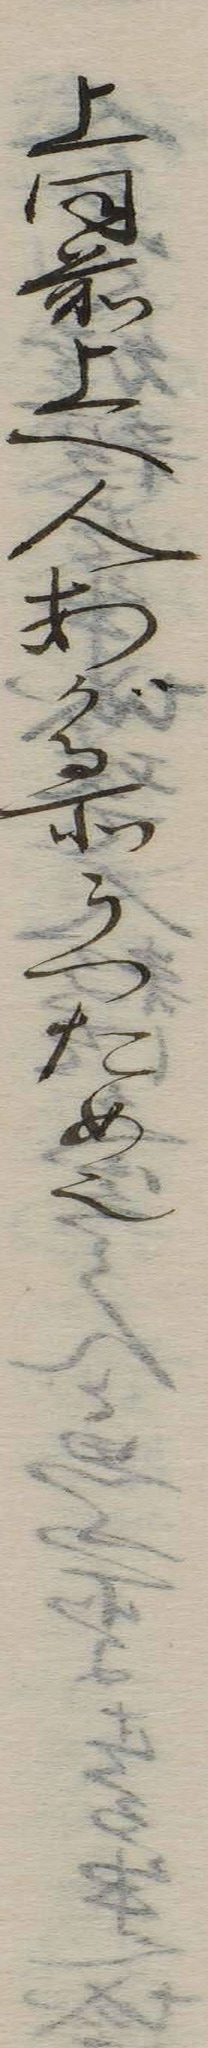上同前上へ人あがる所うつため也
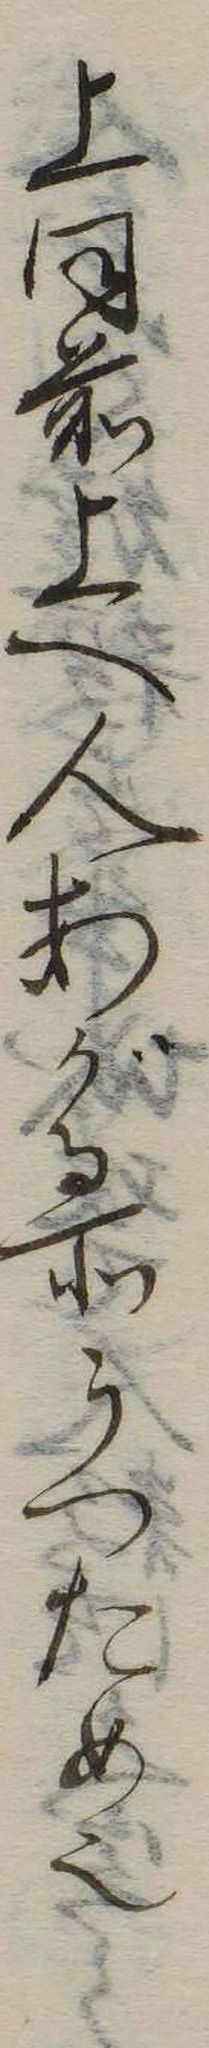上同前上へ人あがる所うつため也
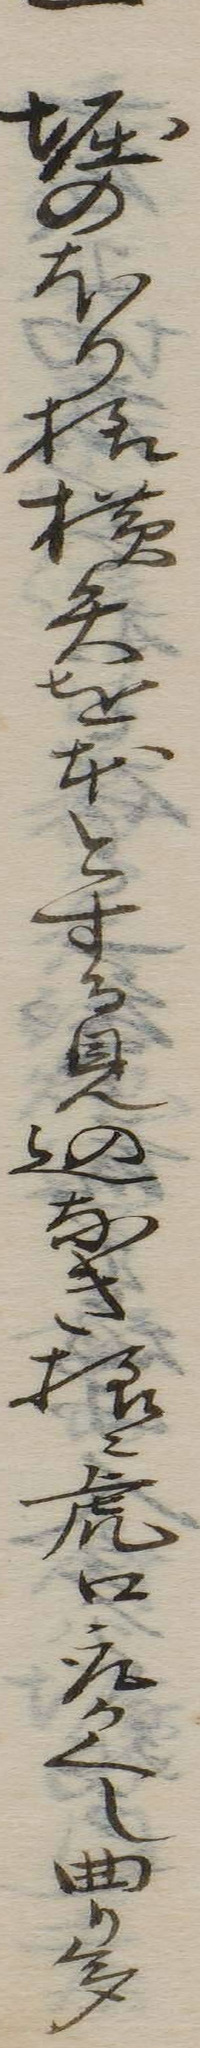一堀のほり様横矢を本とする見込なき様ニ虎口取かくし曲り多
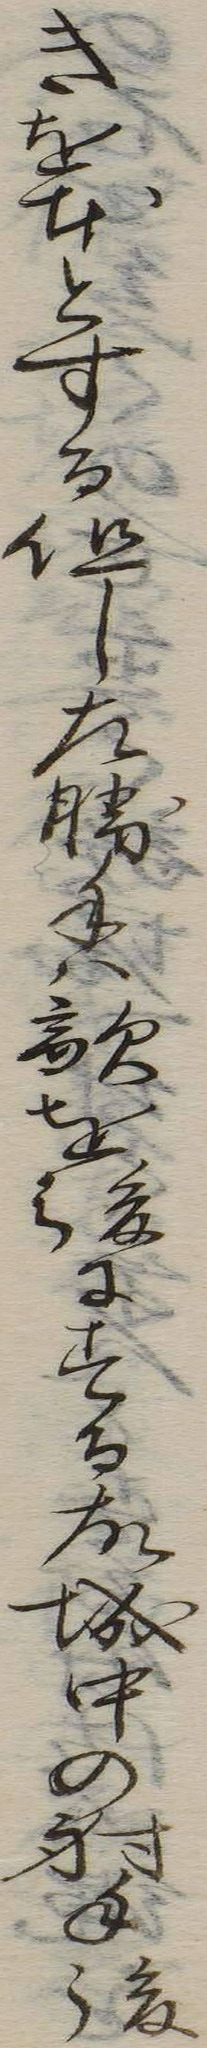きを本とする但し左勝手は敵を後にする故城中の射手後
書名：三河之物語
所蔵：国文学研究資料館
